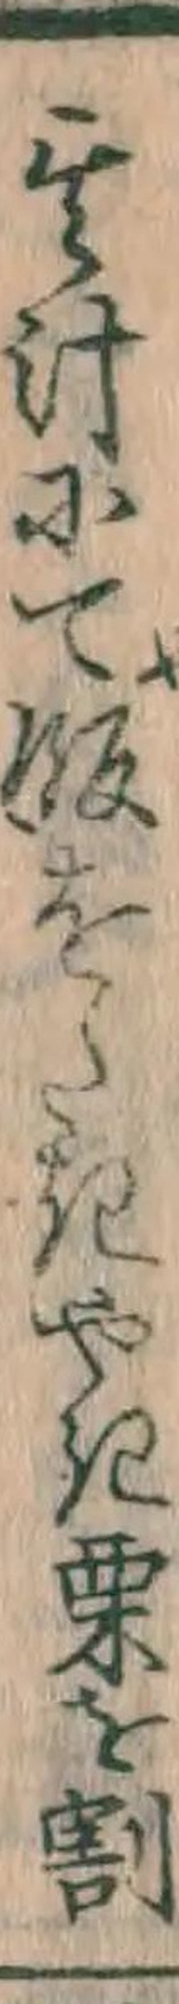其汁にて飯をたきやき栗を割
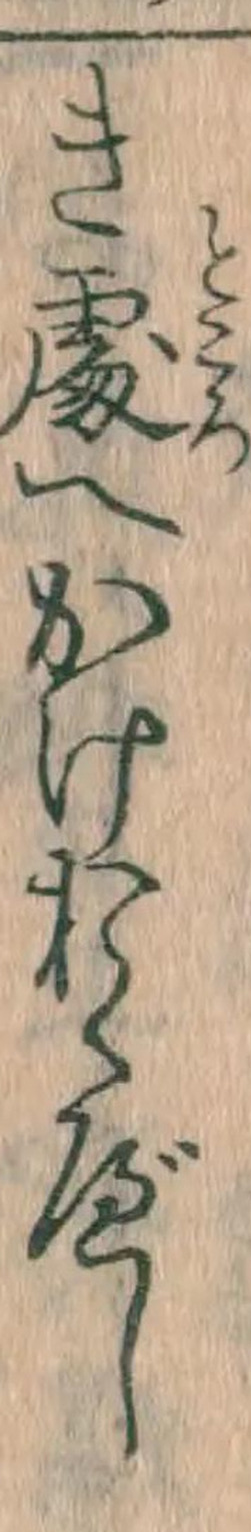き処へかけおくべし
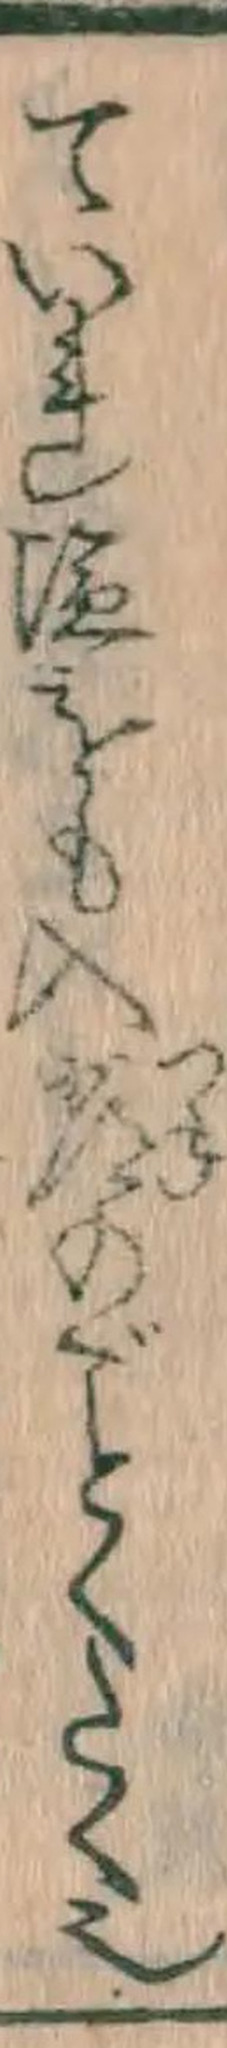ていれ塩とも入常のごとくたく也
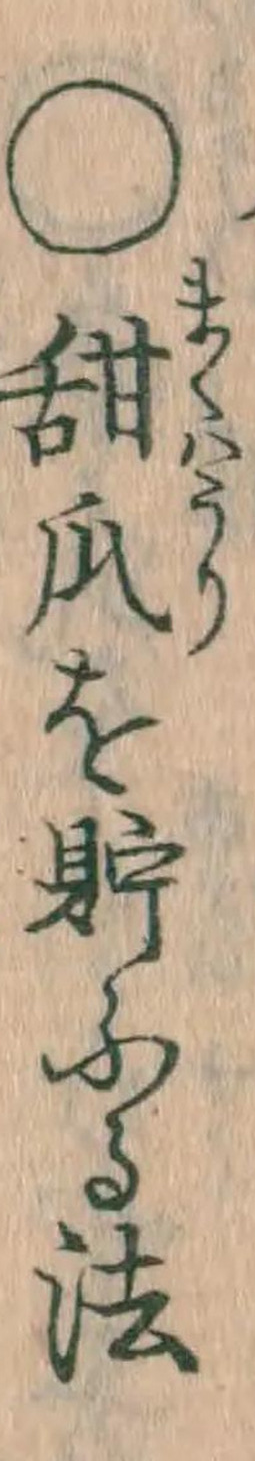○甜瓜を貯ふる法
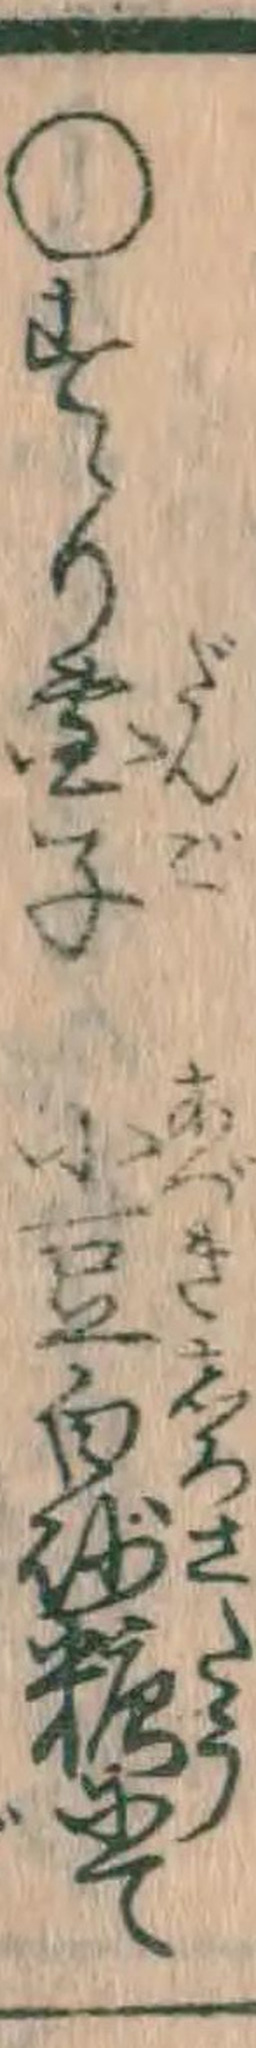○すゝり団子小豆白砂糖にて
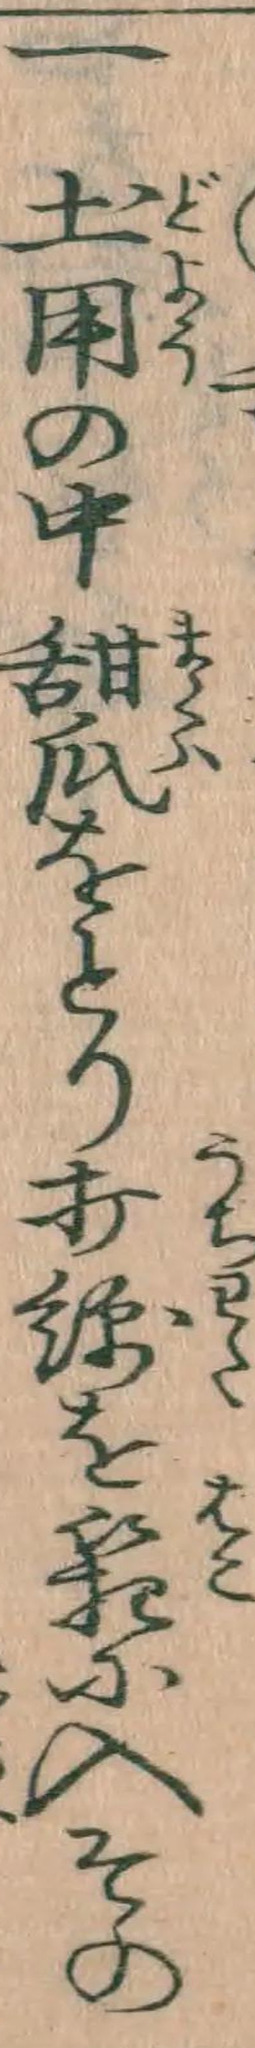一土用の中甜瓜をとり打綿を箱に入その
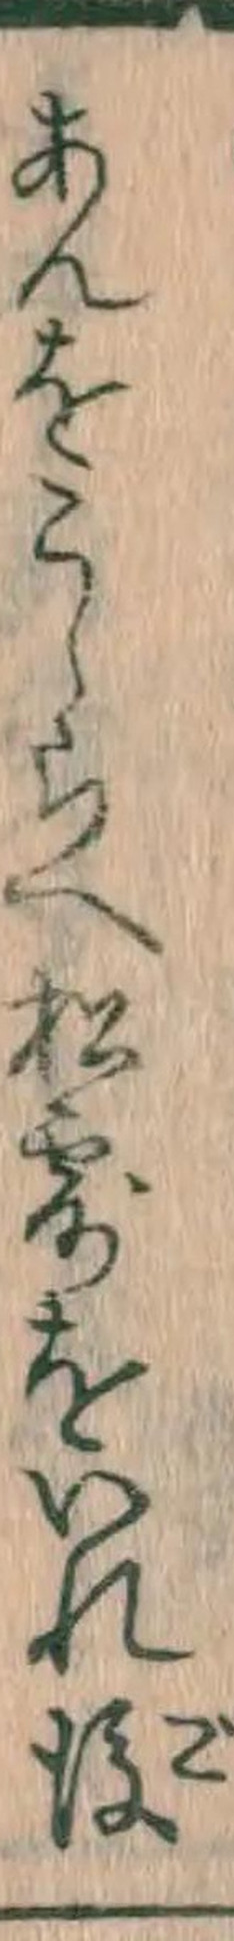あんをこしらへ松露をいれ後
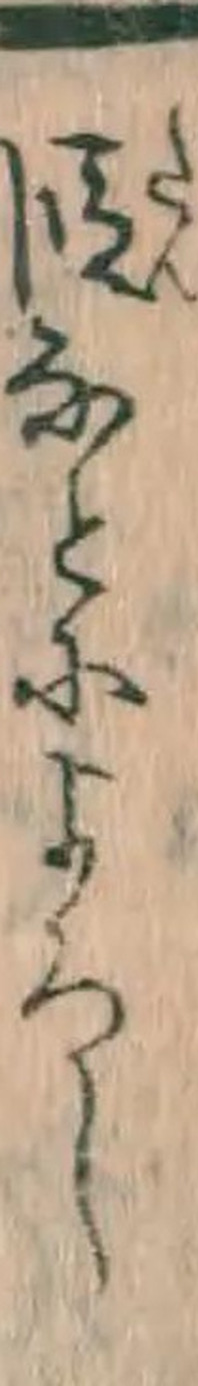段なとによろし
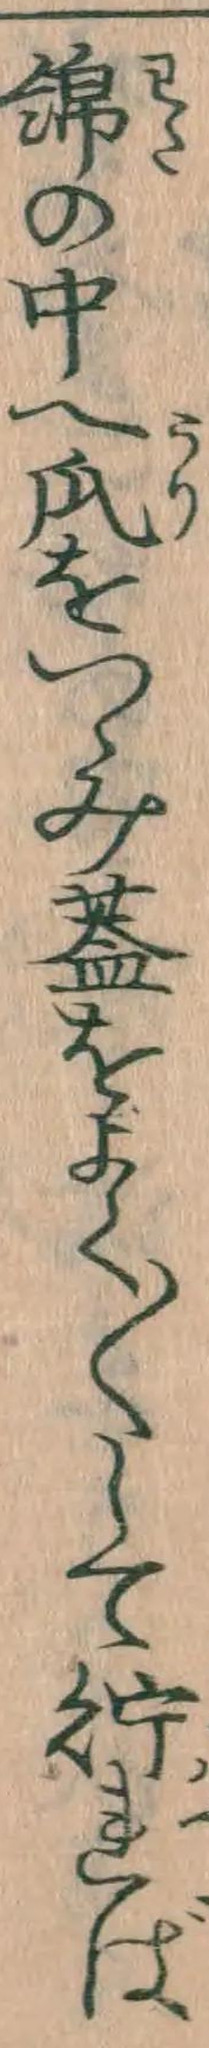綿の中へ瓜をつゝみ蓋をよく〳〵して貯れば
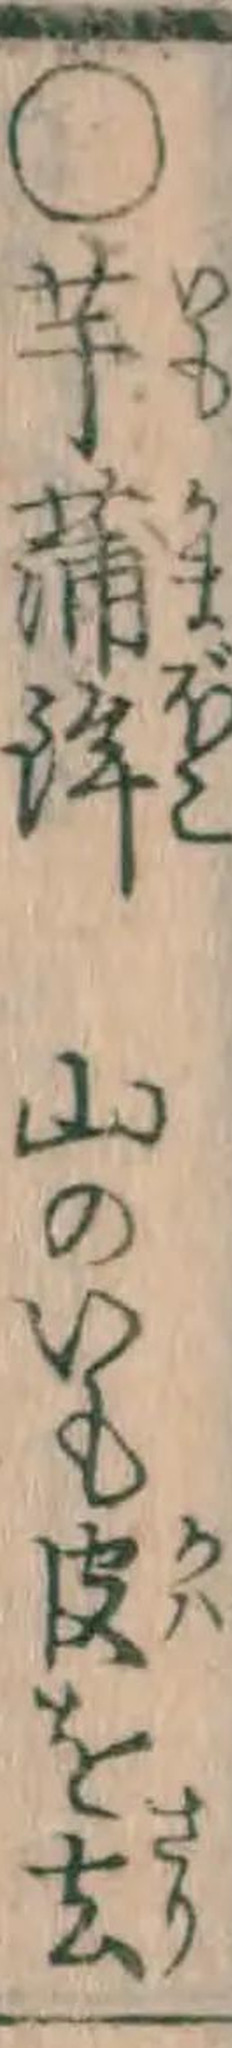○芋蒲鉾山のいも皮を去
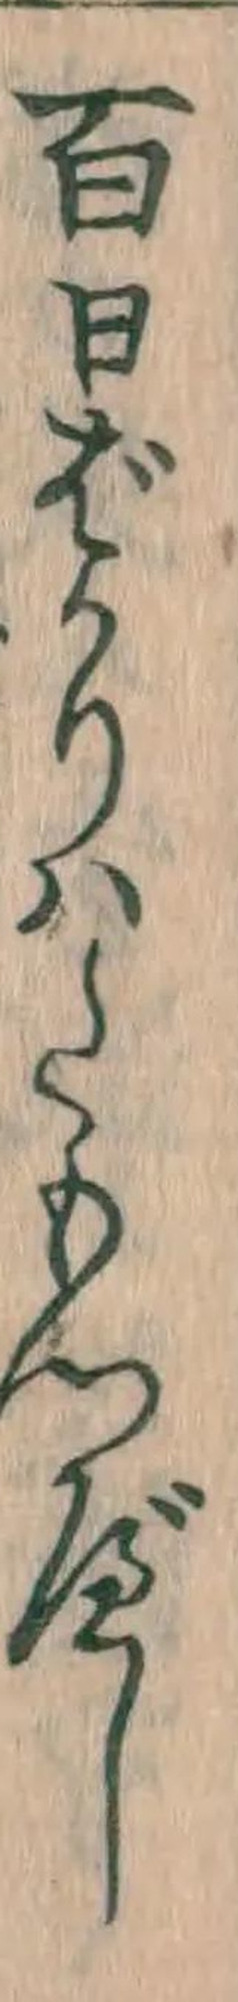百日ばかりはたもつべし
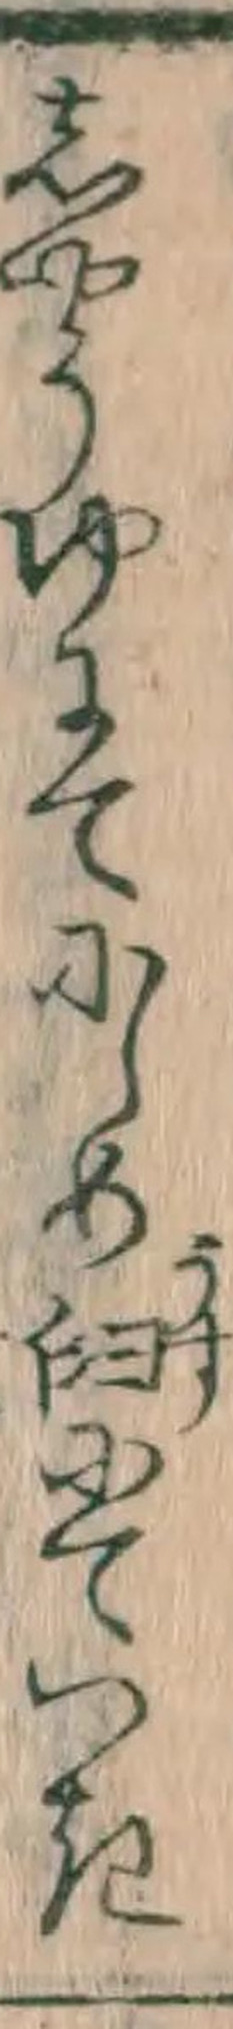しやうゆにてにしめ臼にてつき
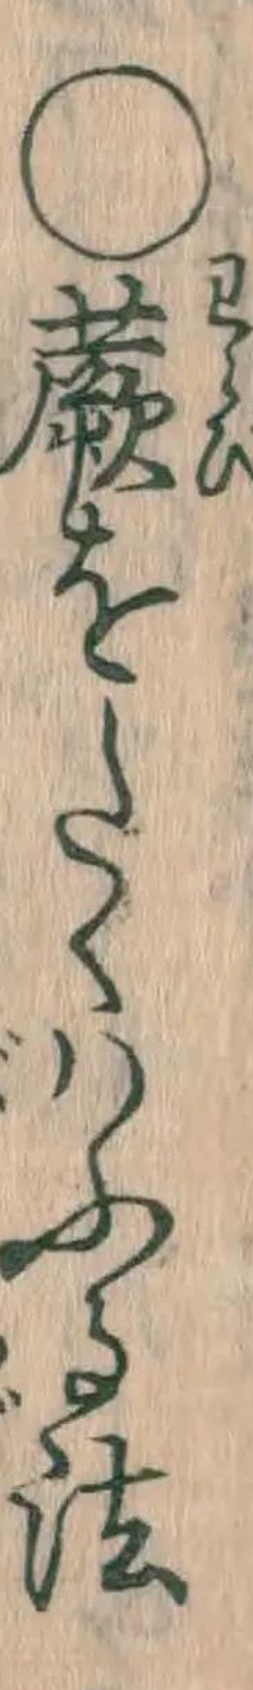○蕨をたくはふる法
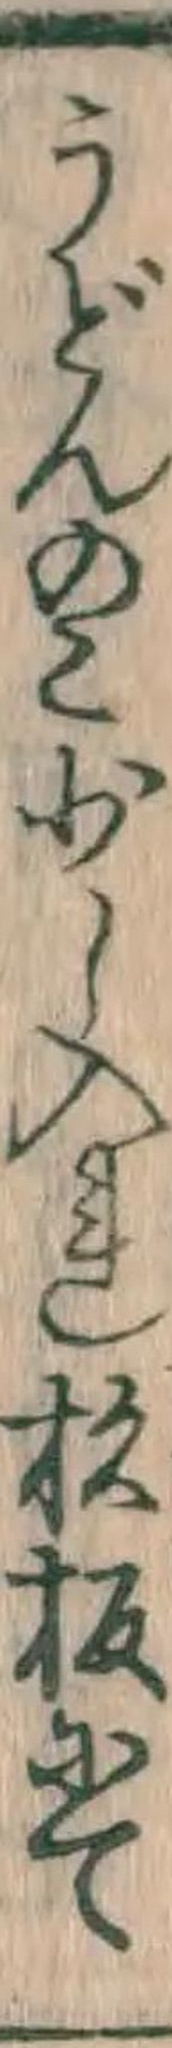うどんのこ少し入れ杉板にて
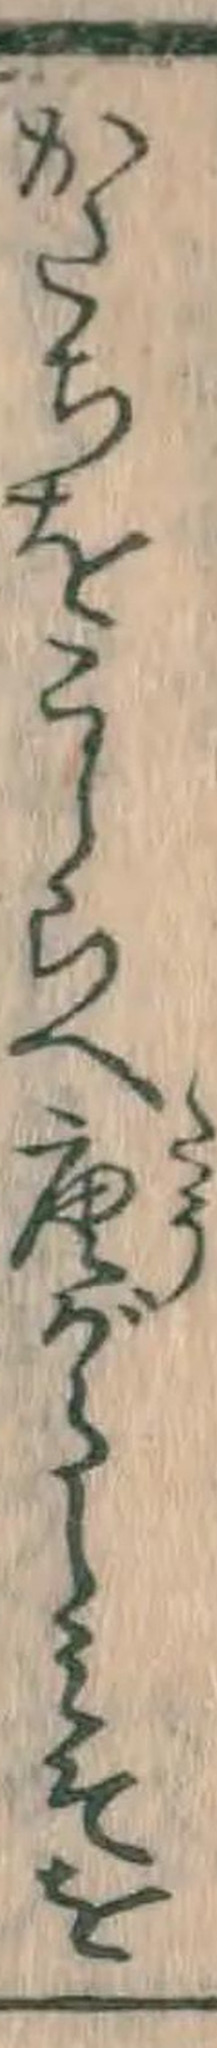かたちをこしらへ唐がらしみそを
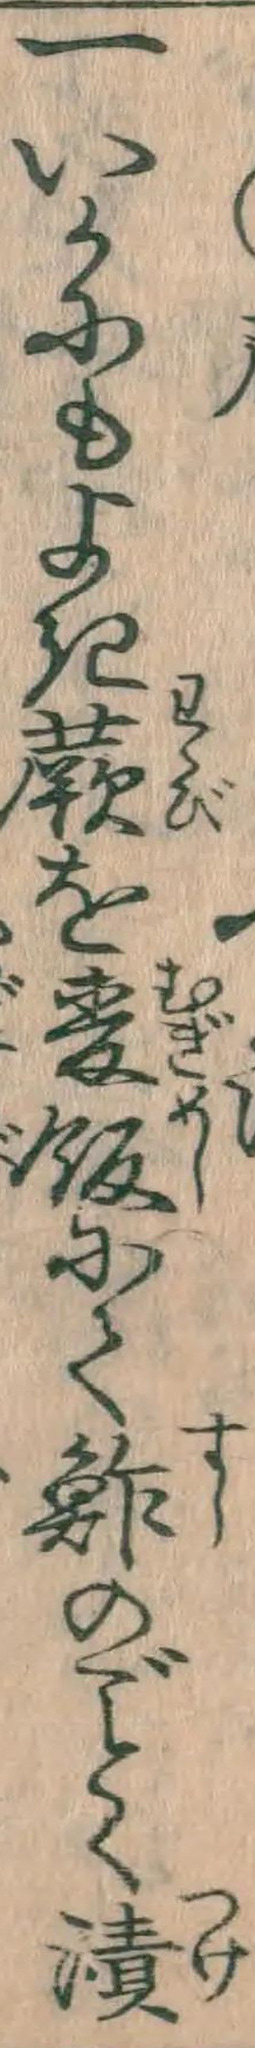一いかにもよき蕨を麦飯にて鮓のごとく漬
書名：広益秘事大全 3巻. [5]
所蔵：国立国会図書館 National Diet Library, JAPAN
